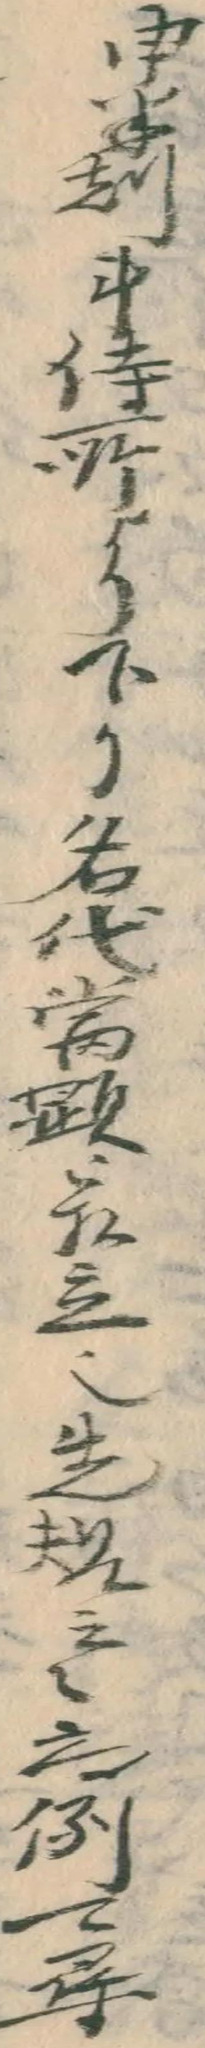申半刻斗侍所より下り名代當顕被相立也先規云々尚例可尋
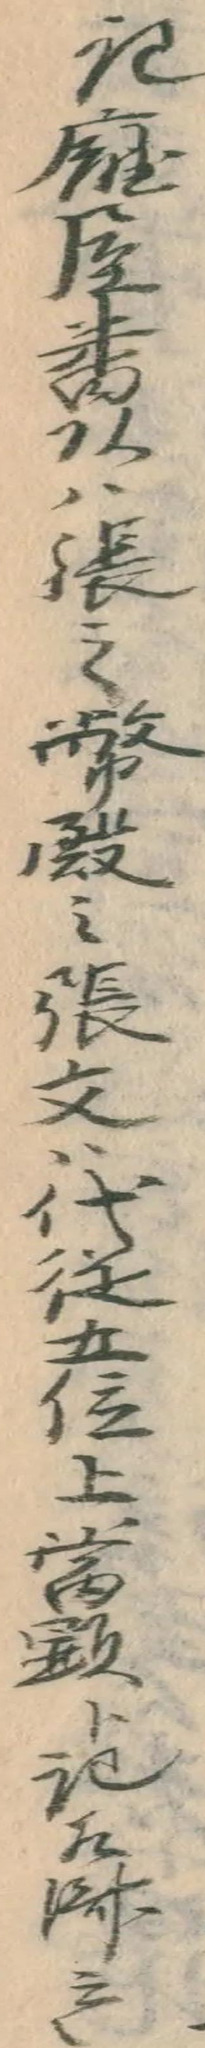記廰屋番頭ハ張之幣殿之張文ハ代従五位上當顕ト記相済云々

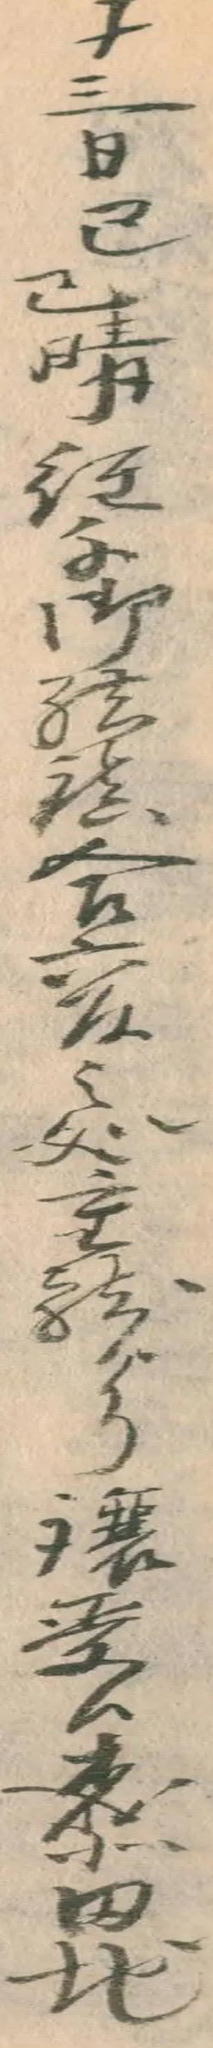十三日己巳晴経千御結鎮合六反之処重龍より譲受森北田地
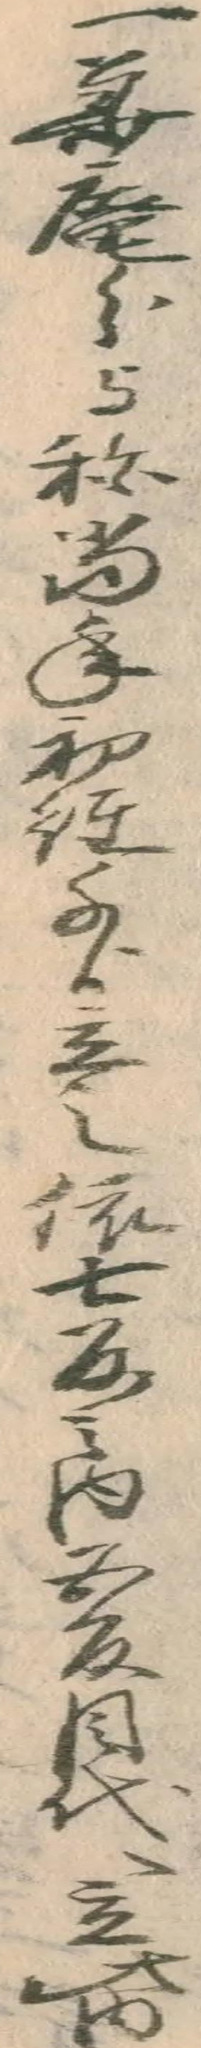一華庵分と称當年初経千ゟ立之依七反之内五反目代へ立此内
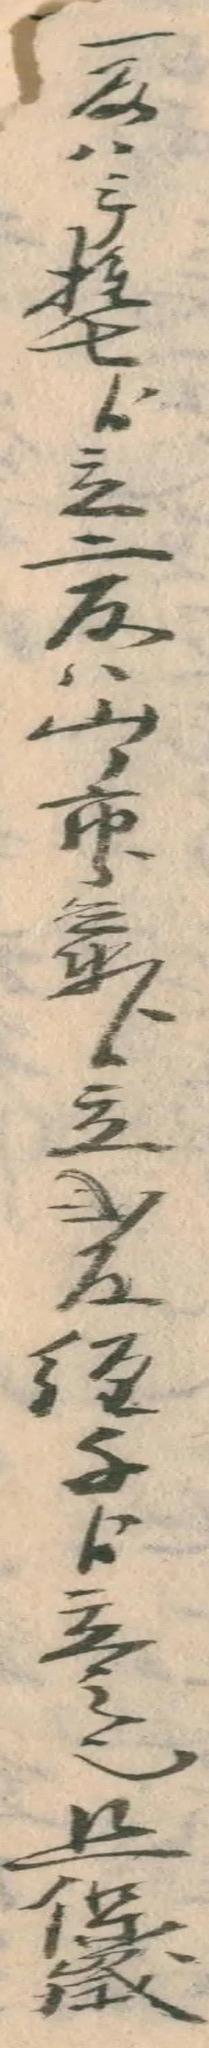一反ハ三ノ権七ゟ立二反ハ山ノ市郎兵衛ゟ立弐反経千ゟ立之也且保歳
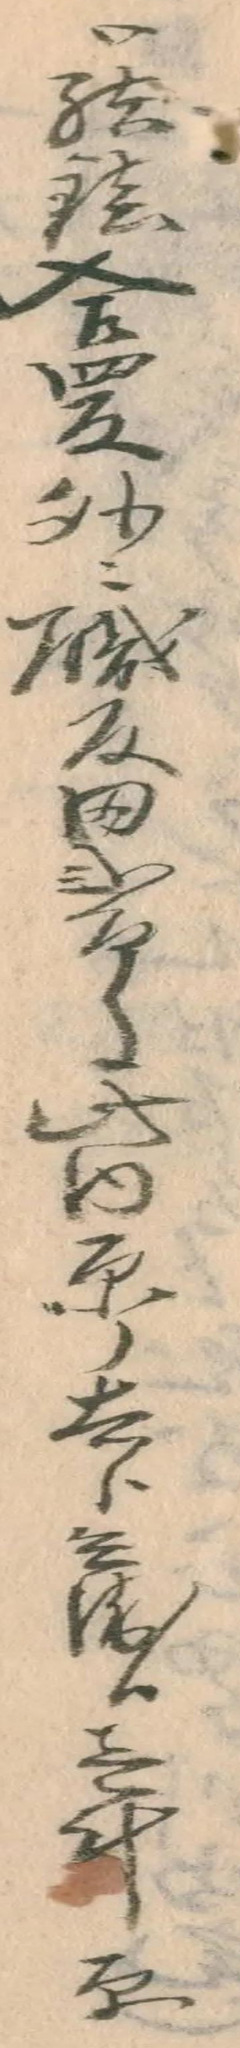御結鎮合四反外ニ職及田弐百文此内原ノ太郎兵衛ゟ壱斗原
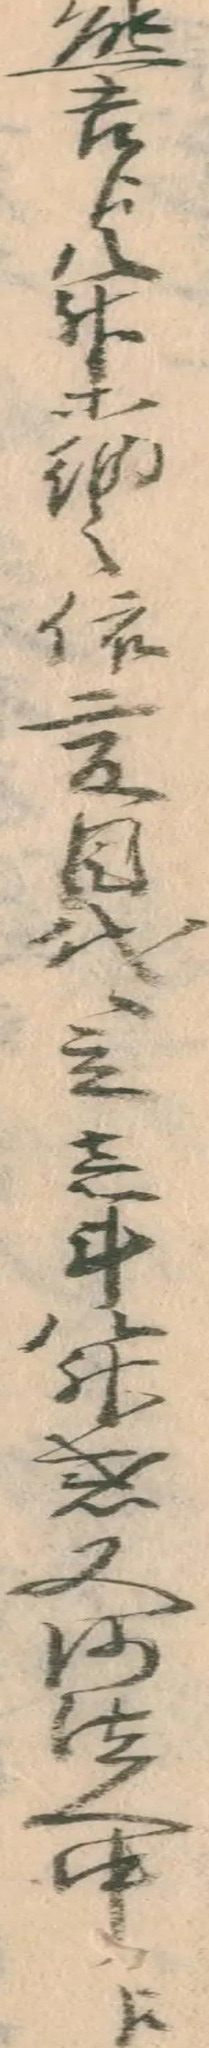熊吉ゟ八升等納之依二反目代へ立壱斗八升は又沙汰人中え
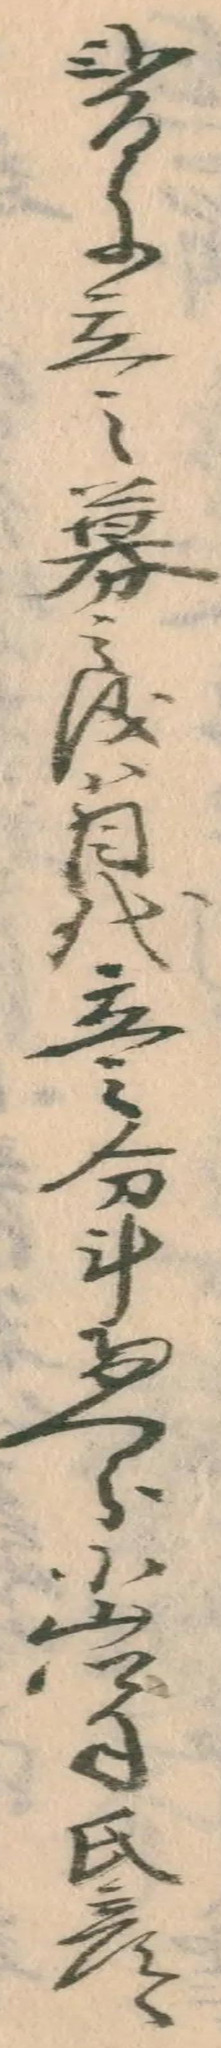弐百文立之募之儀ハ目代立之分斗両人分小山郷司氏彦へ
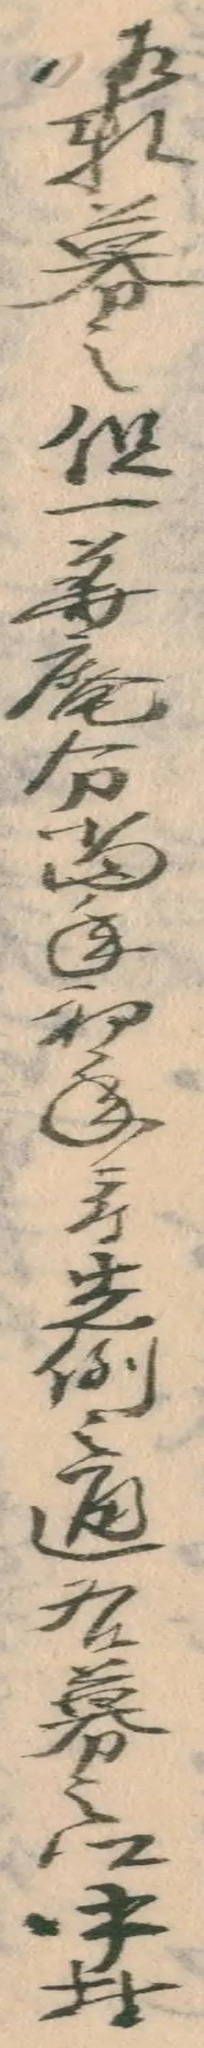昨頼募之但一華庵分當年初年ニ付先例之通格募之郷中村
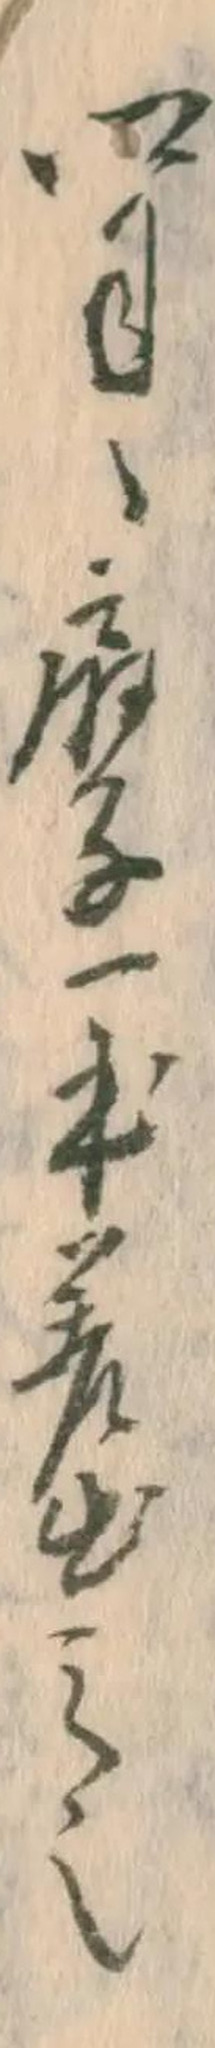郷司へ扇子一本差出之也
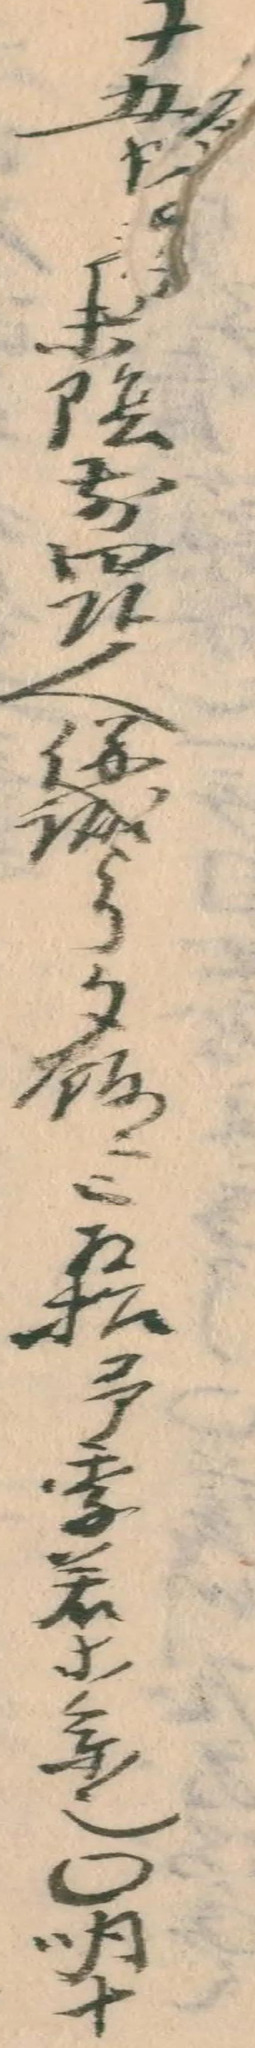十五日辛未陰前四頭人保誠より夕飯ニ被相招予季若等参也○明十
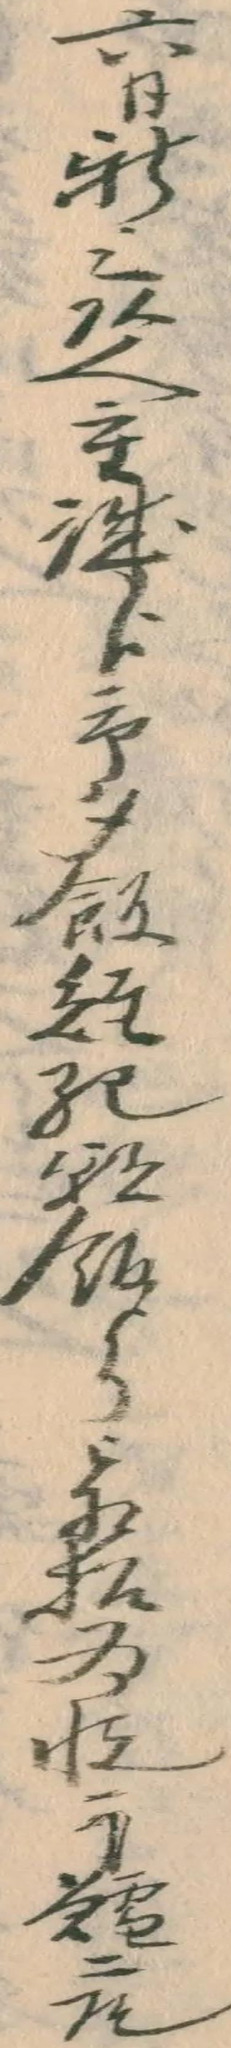六日新三頭人重誠ゟ予夕飯経紀朝飯より被相招為祝干鱈二尾
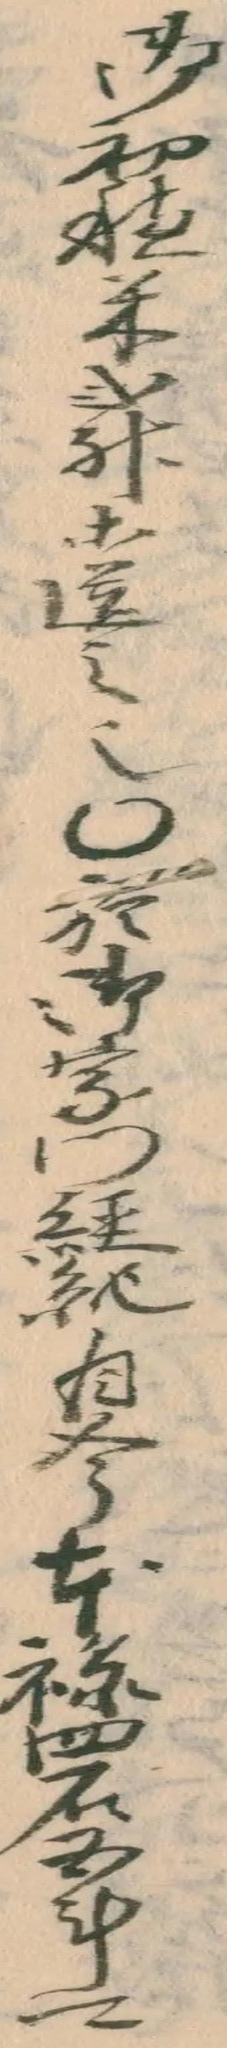御初穂米弐升等送之也○於御家門経紀自今本禄四石五斗可
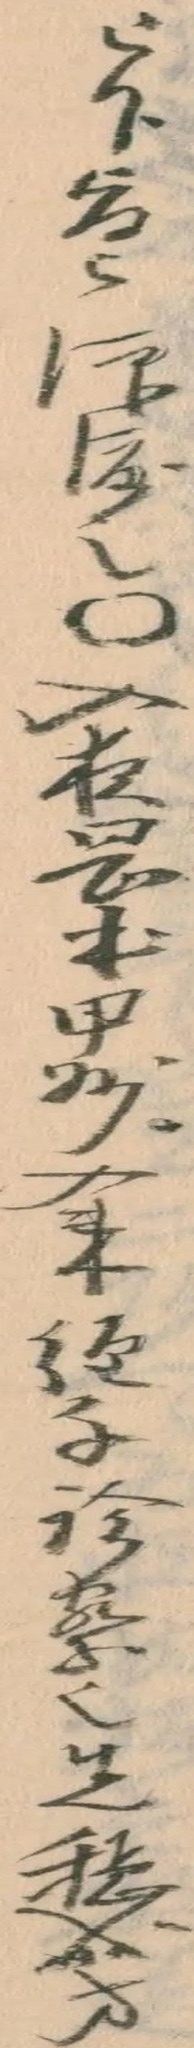被下旨被仰渡也〇入夜岡本甲州入来経千診察也先穂成方
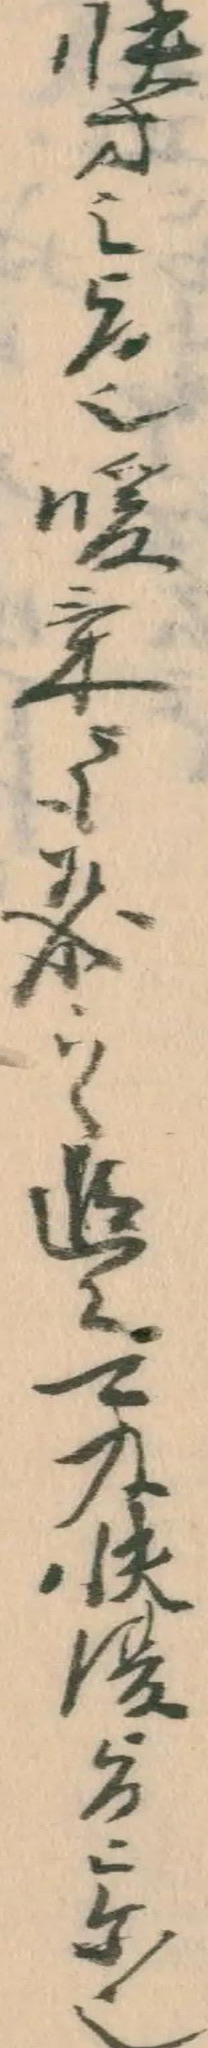快方之旨也暖気ニも相成候ハヽ追々可及快復旨被示也
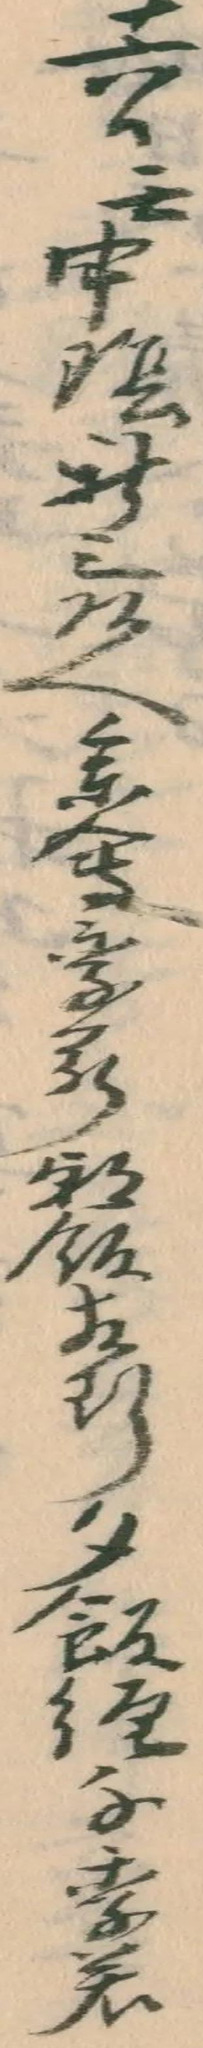十六日壬申陰新三頭人参會季若朝飯相断夕飯経千季若
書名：賀茂社記録. 第70冊
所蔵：国立国会図書館 National Diet Library, JAPAN
